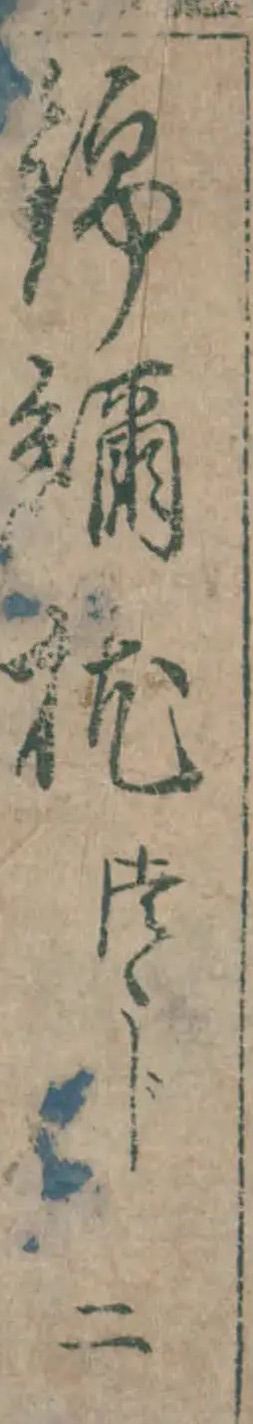錦繍枕つゝじ二

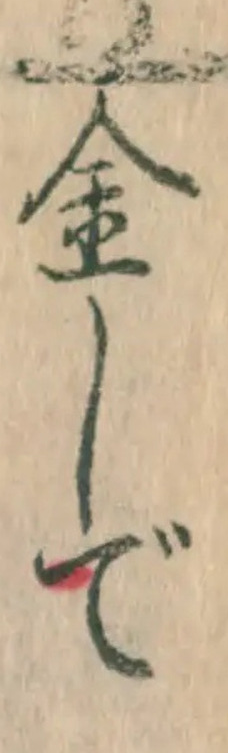○金しで
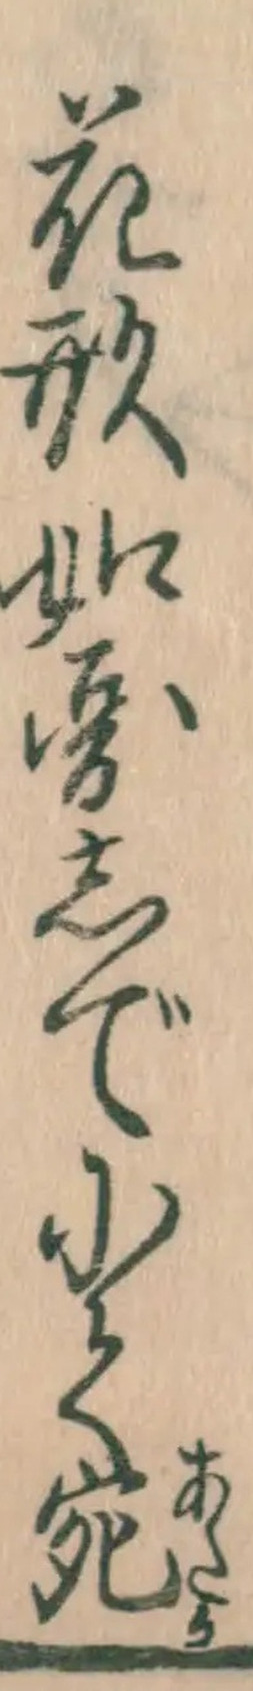花形如図しでにて宛
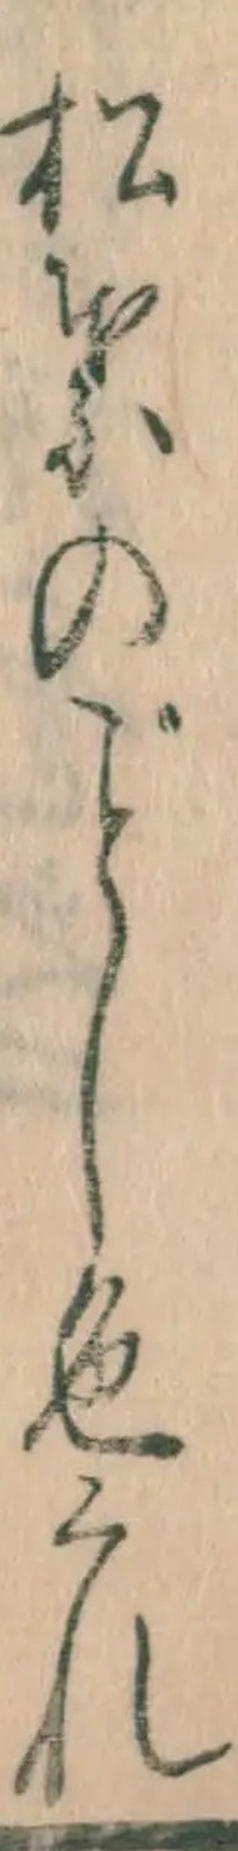松葉のごとし色くれ
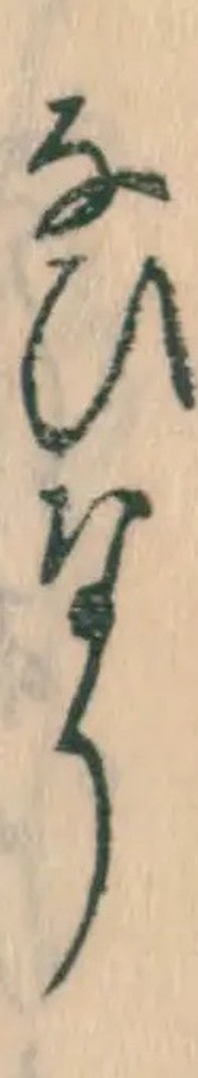なひなり
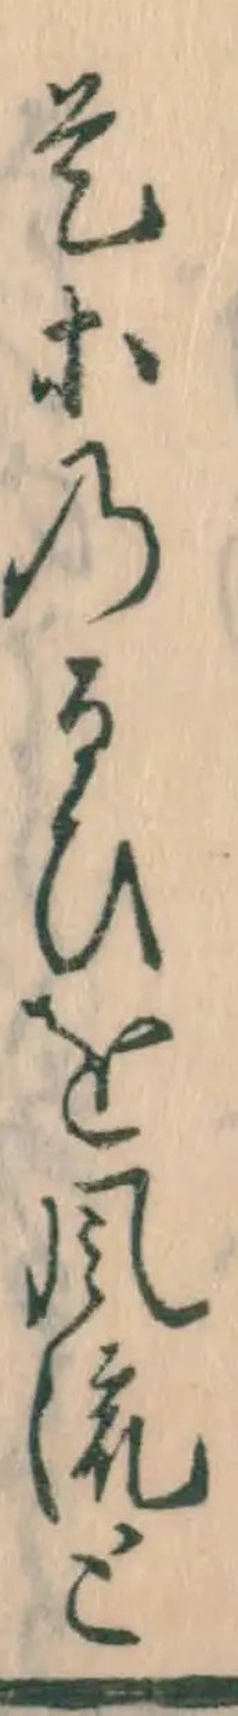是等のるひを風流と
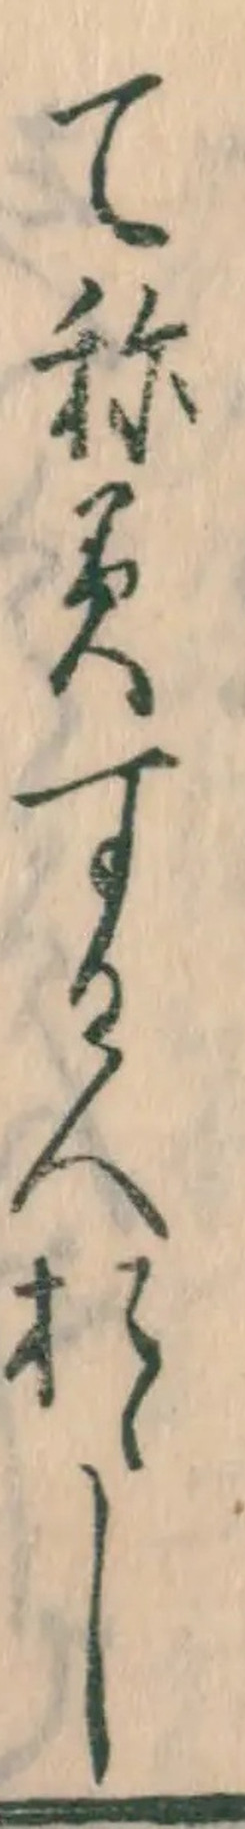て称美する人おゝし
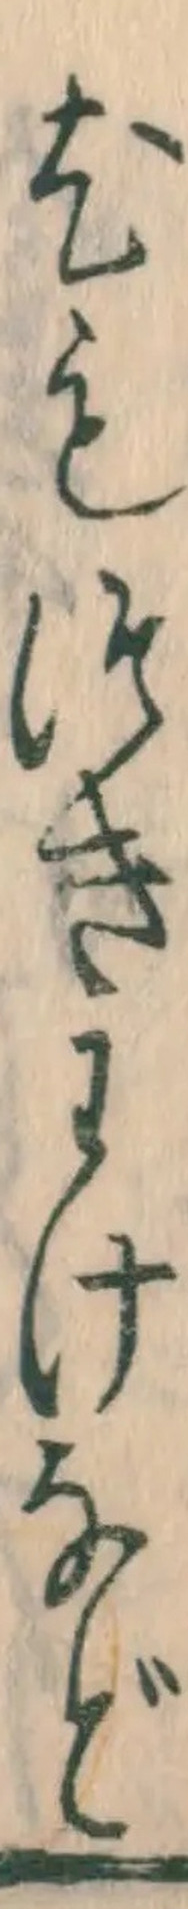花もつきわけなど
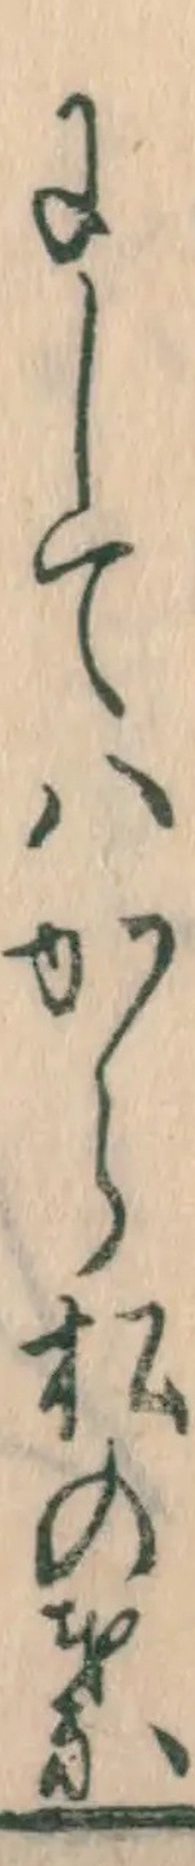にしてはから松の葉
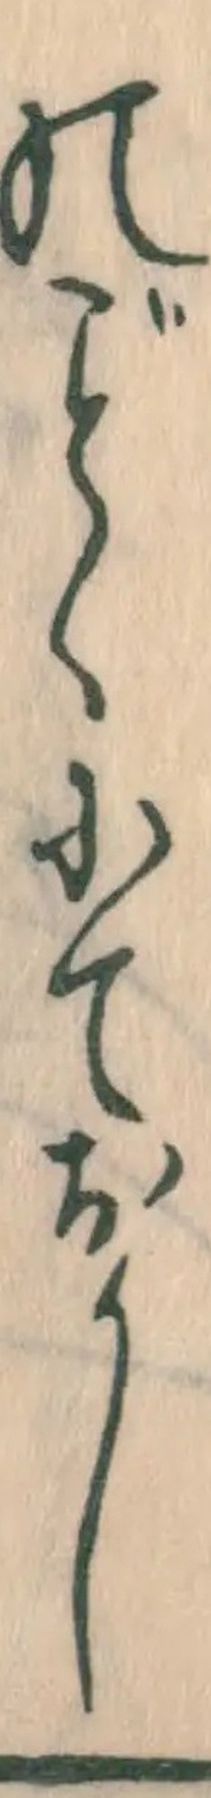のごとくにておかし
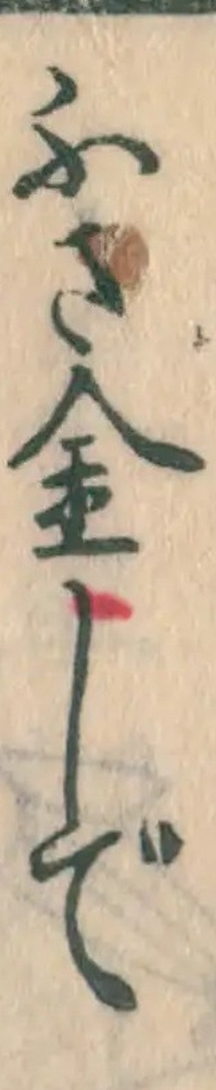ふさ金しで

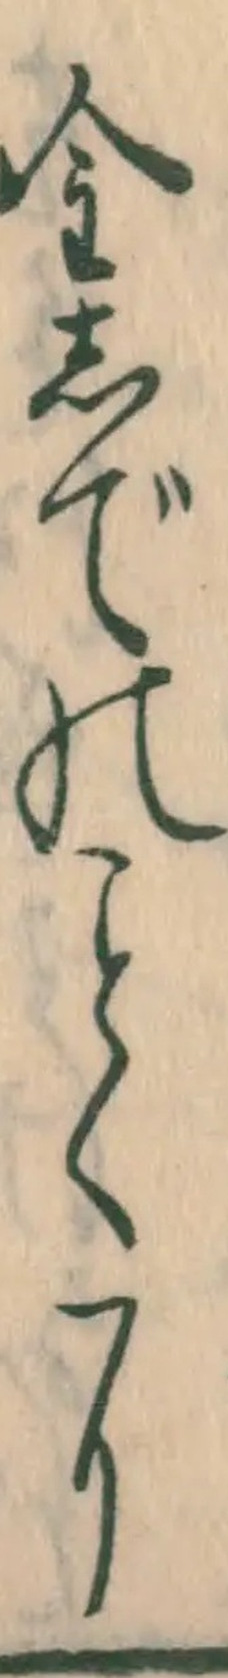金しでのことくに
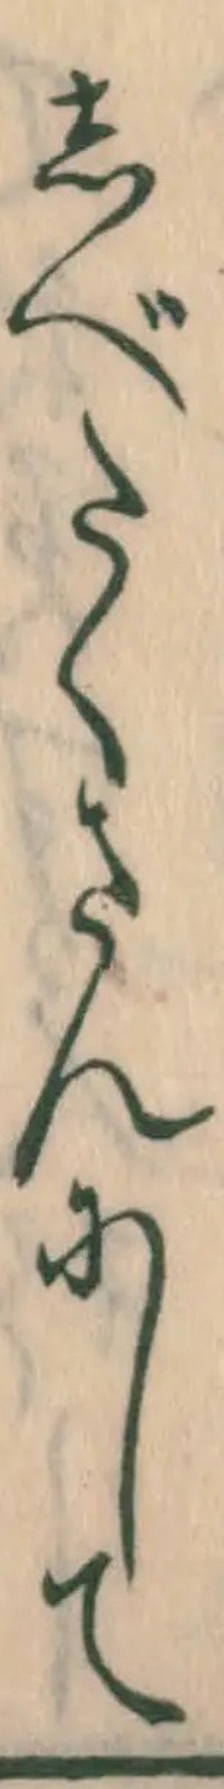しべたくさんにして
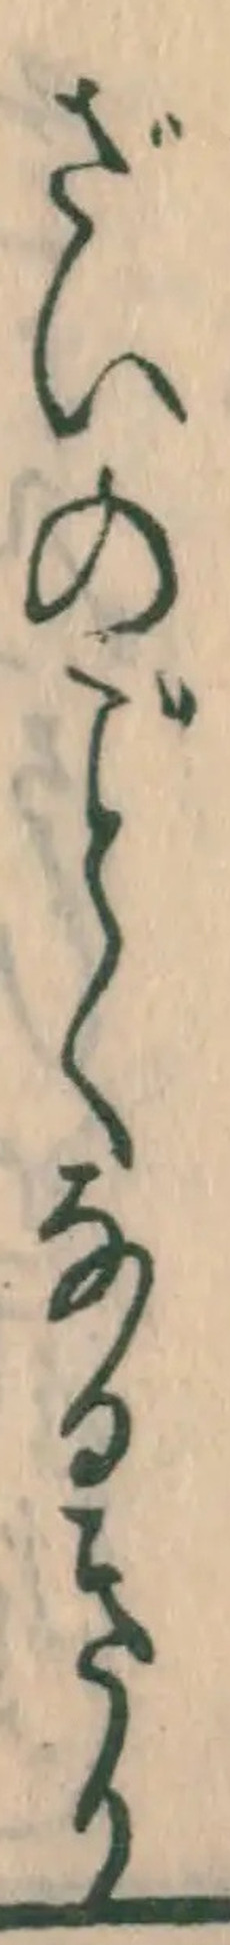ざいのごとくなるきり
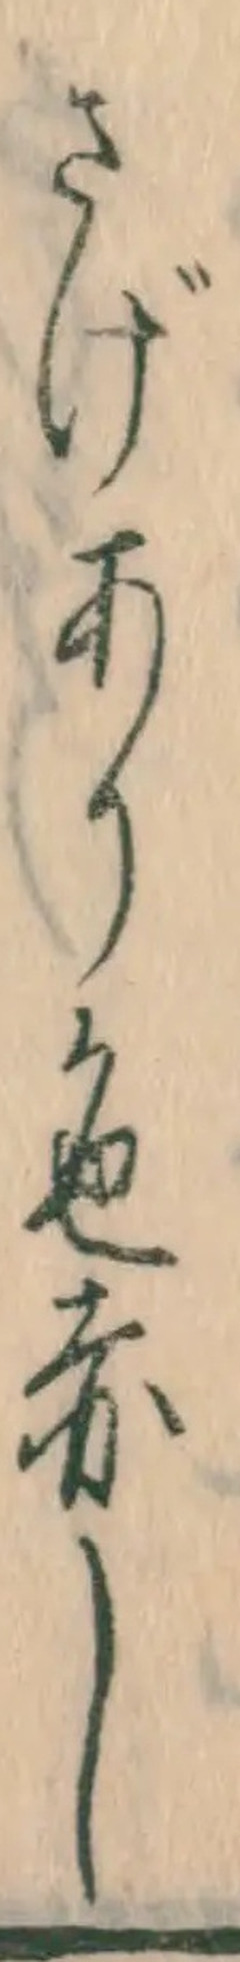さげあり色赤し
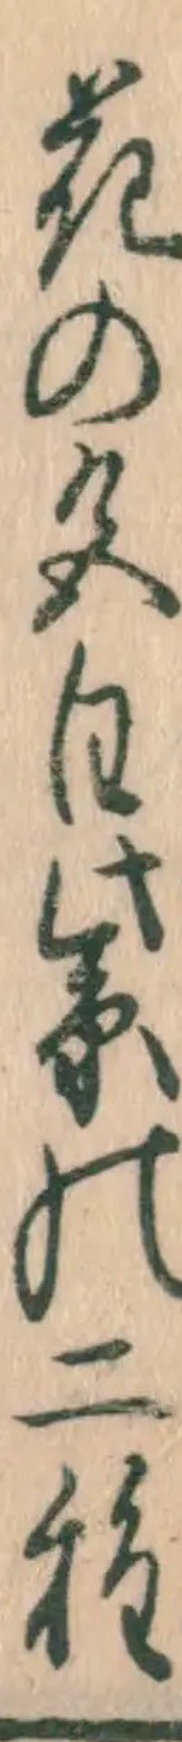花の色白紫の二種
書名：錦繍枕 5巻. [2]
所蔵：国立国会図書館 National Diet Library, JAPAN
